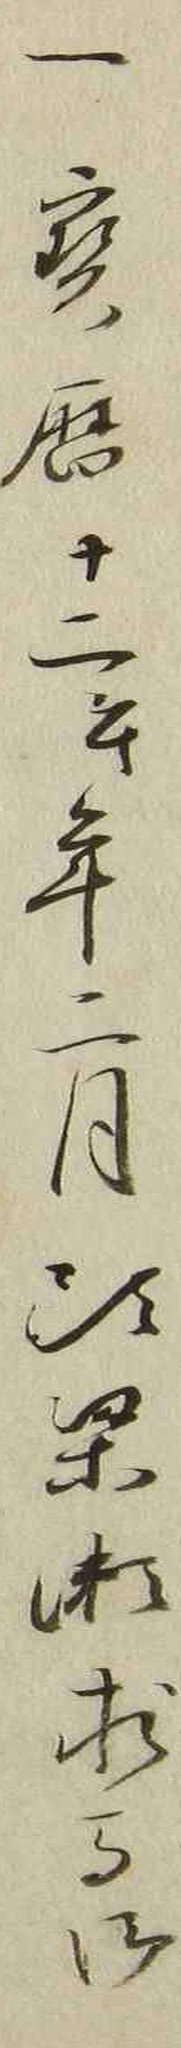一宝暦十二午年二月頭梁瀬求馬御
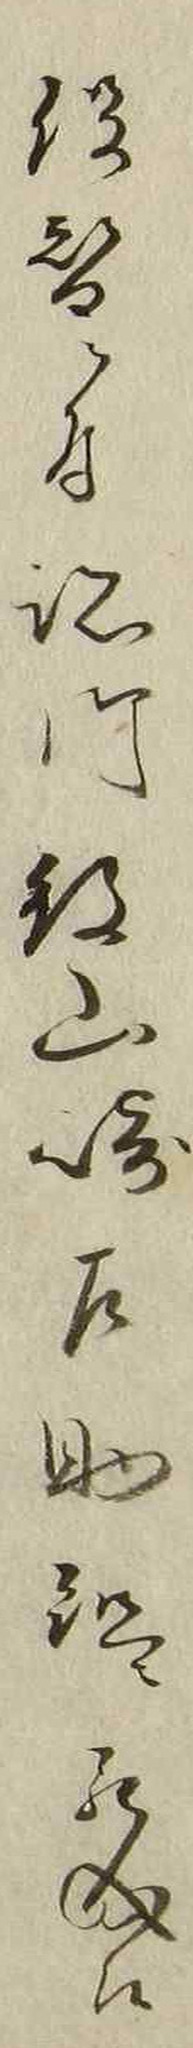役替ニ付跡御役山崎左助組ニ罷成候
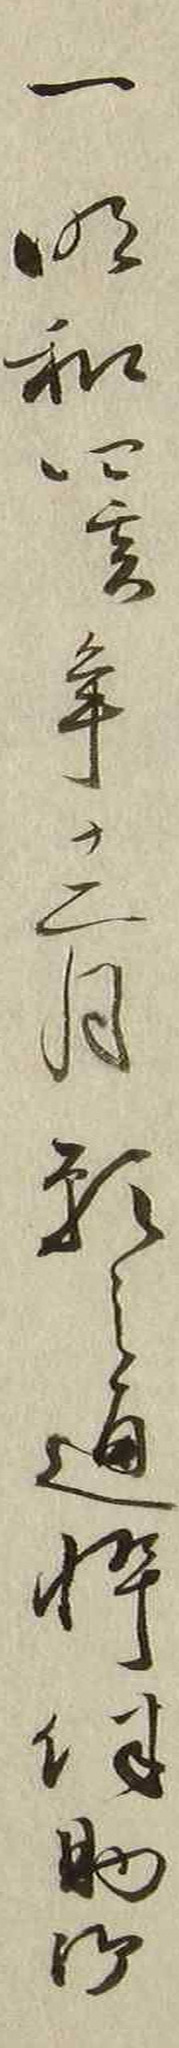一明和四亥年十二月願之通忰伴助御
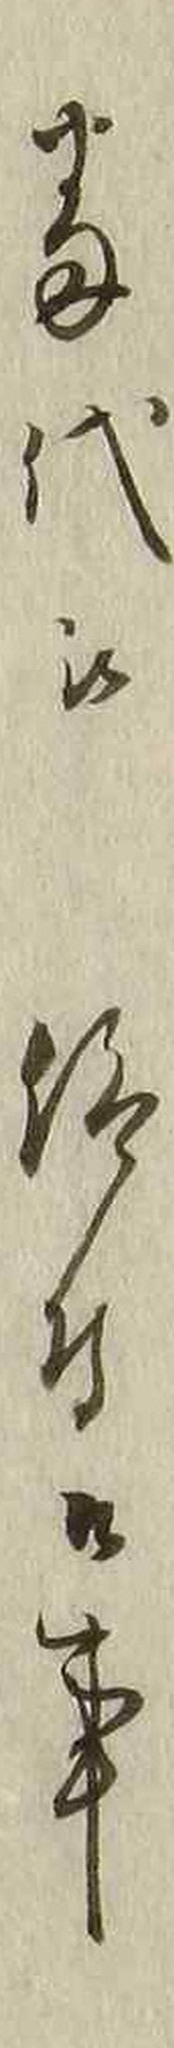番代被仰付候事
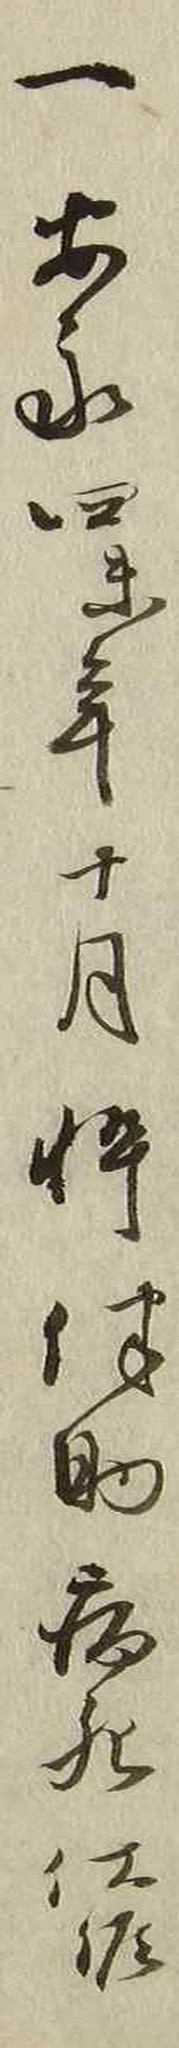一安永四未年十月忰伴助病死仕候
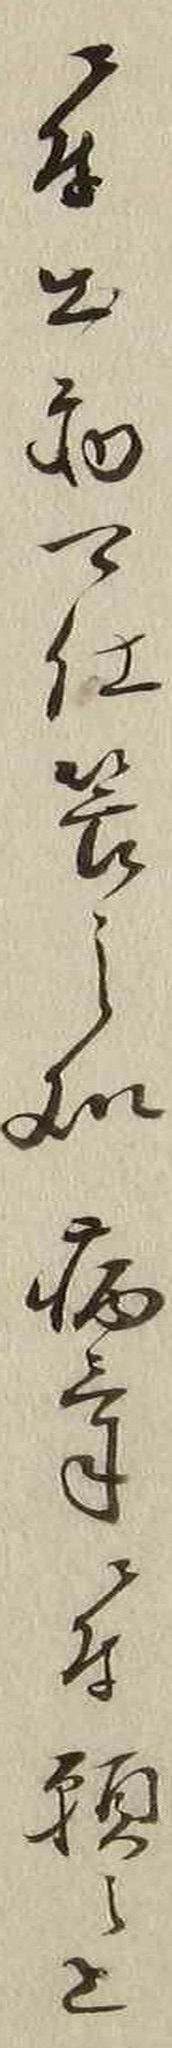ニ付出勤可仕筈之処病気ニ付願之上
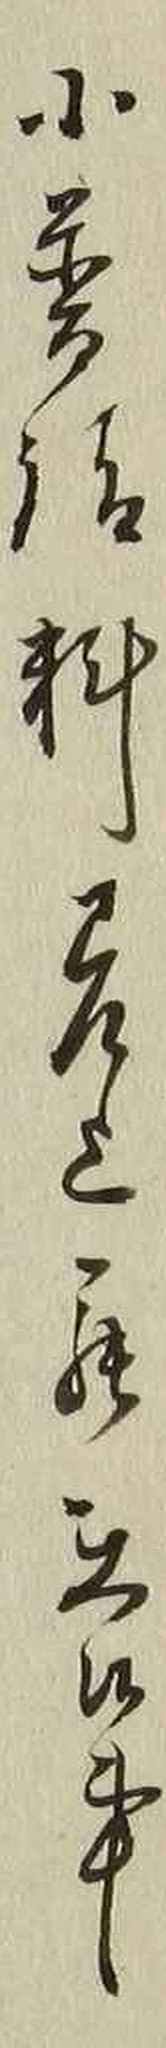小普請料差上罷在候事
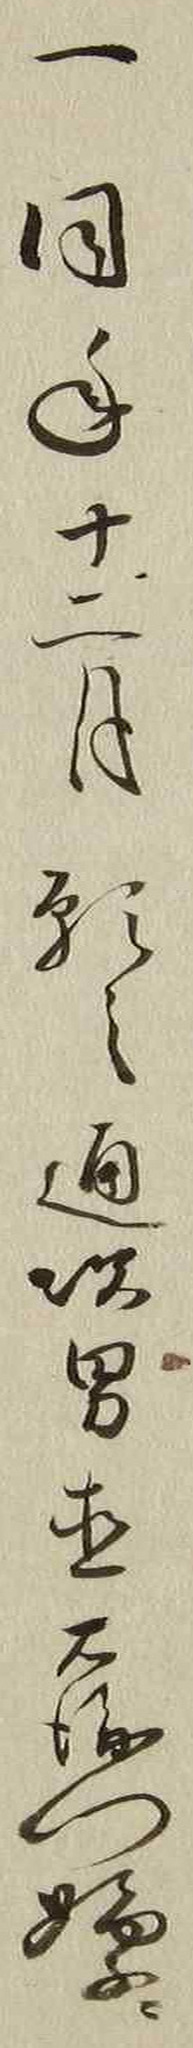一同年十二月願之通次男直右衛門嫡子ニ
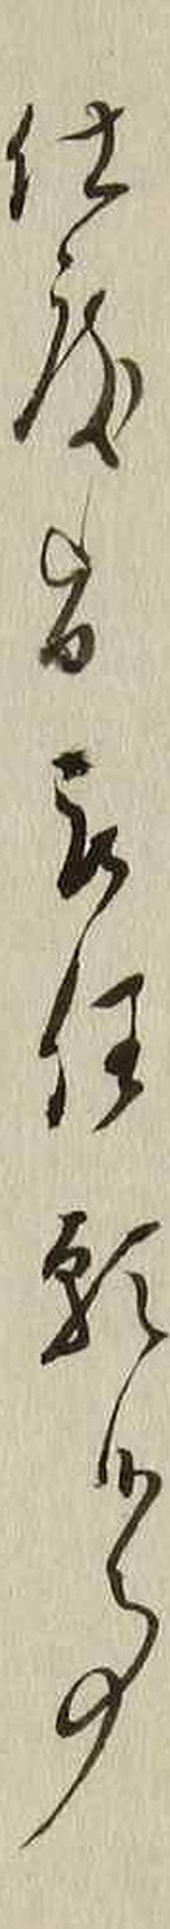仕度旨被任願候事
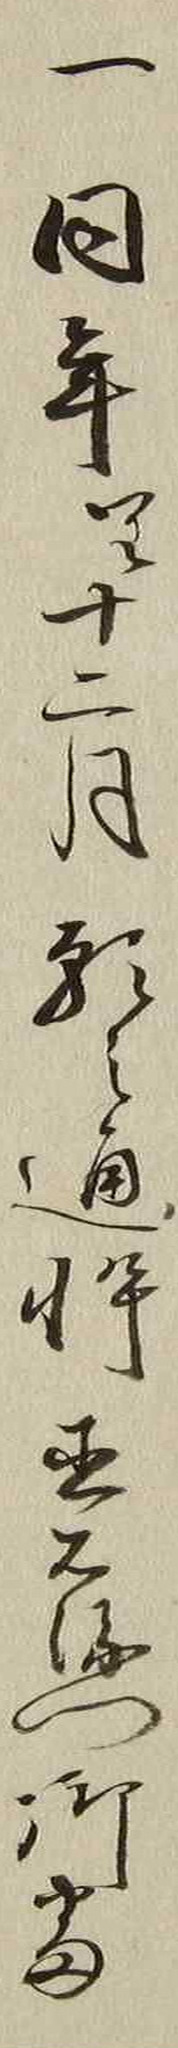一同年閏十二月願之通忰直右衛門御番
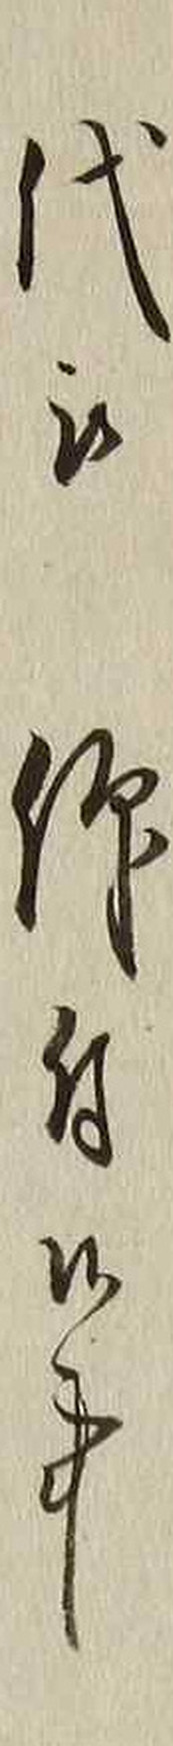代被仰付候事
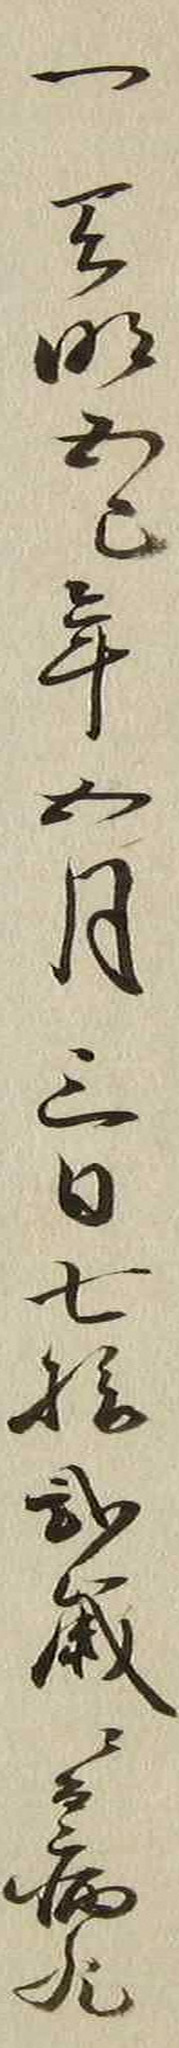一天明五巳年五月三日七拾弐歳ニ而病死
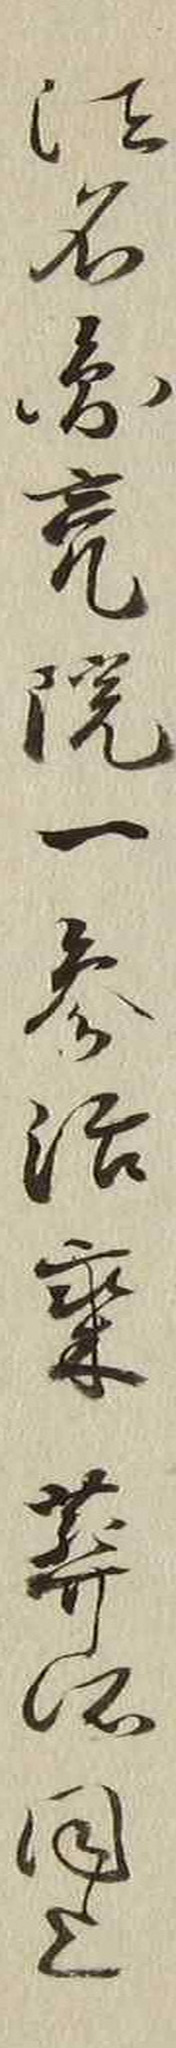法名円亮院一参治葬所同上
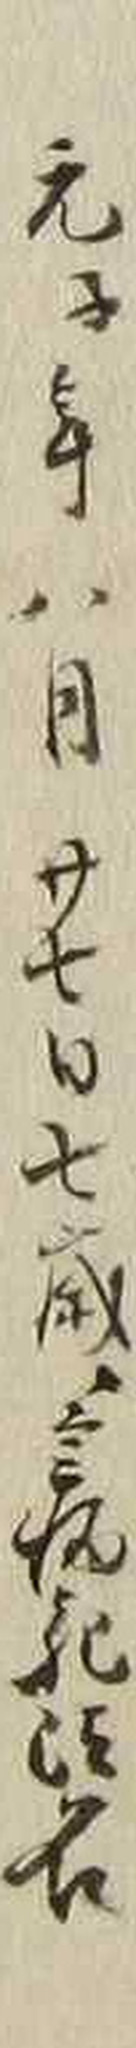元子年八月廿七日七歳ニ而病死法名
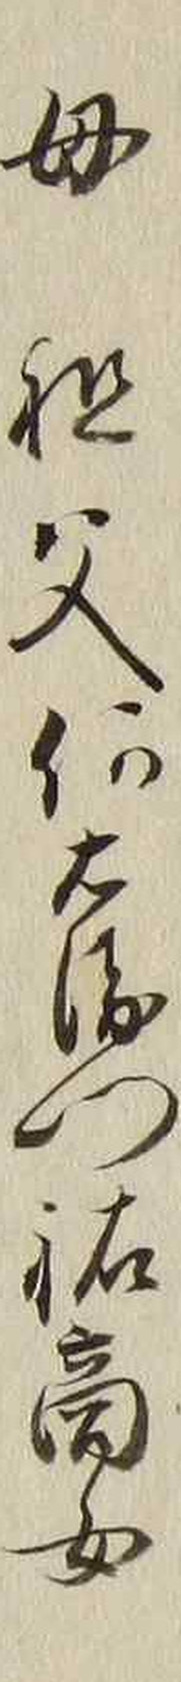母祖父何右衛門祐商女
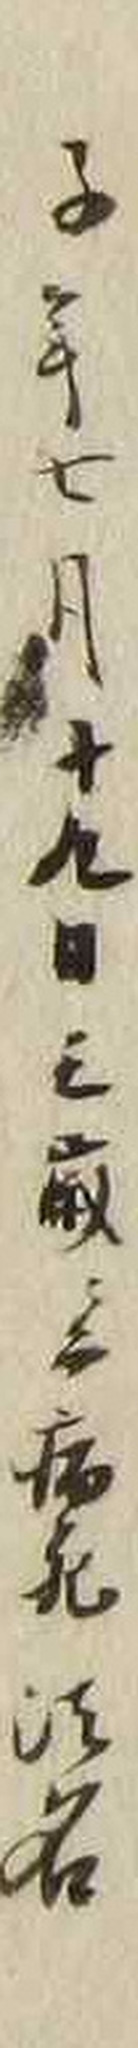子年七月十九日三歳ニ而病死法名
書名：諸士系譜　巻之25　い之部25
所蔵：会津若松市立会津図書館
